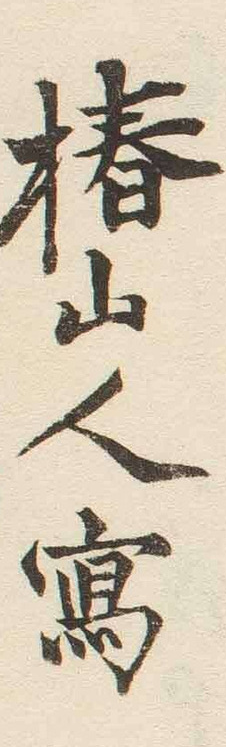椿山人寫

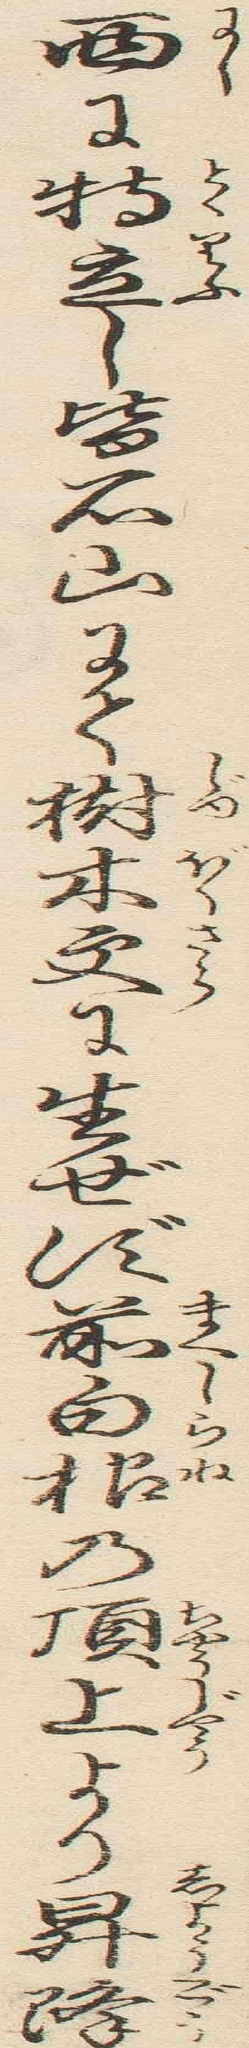西に特立し皆石山にて樹木更に生ぜず前白根の頂上より昇降
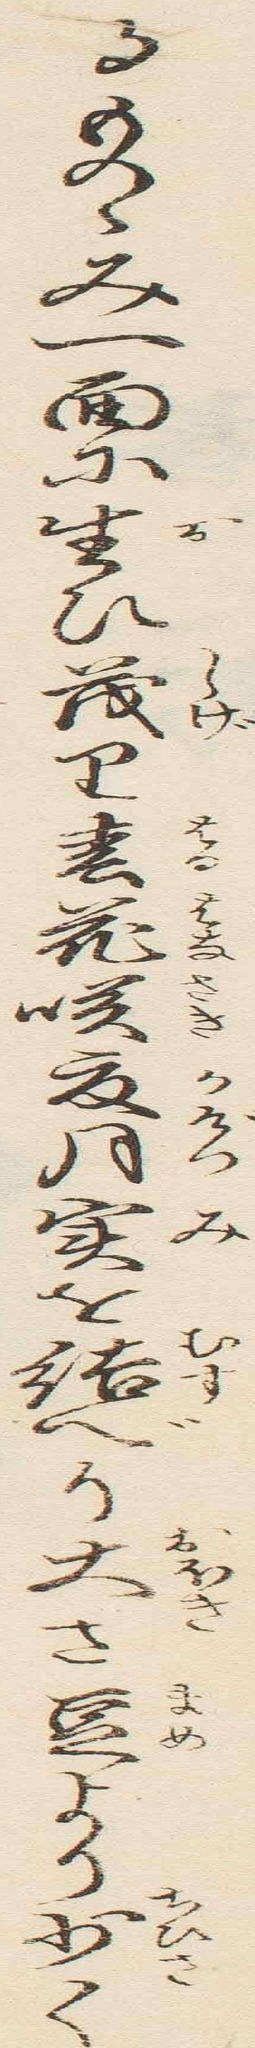るものゝみ一面に生ひ茂り春花咲夏月実を結べり大さ豆より少く
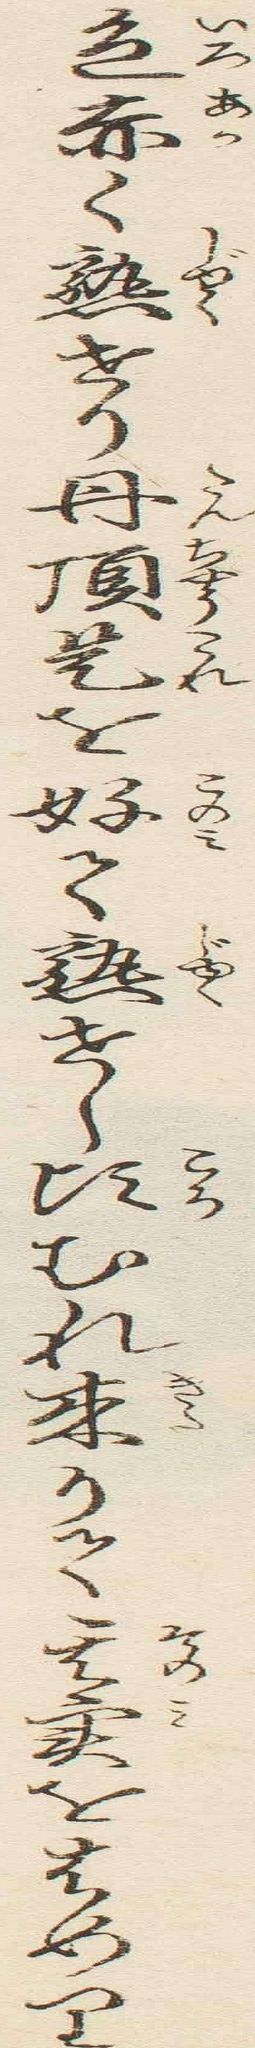色赤く熟せり丹頂是を好て熟せし頃むれ來りて其実をはめり
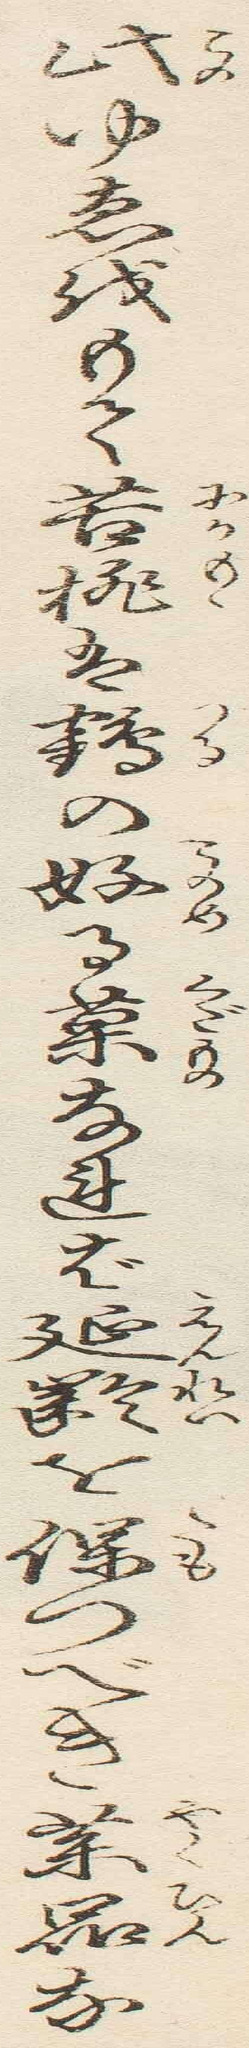此ゆゑをもて苦桃は鶴の好る菓なれば延齢を保つべき薬品な
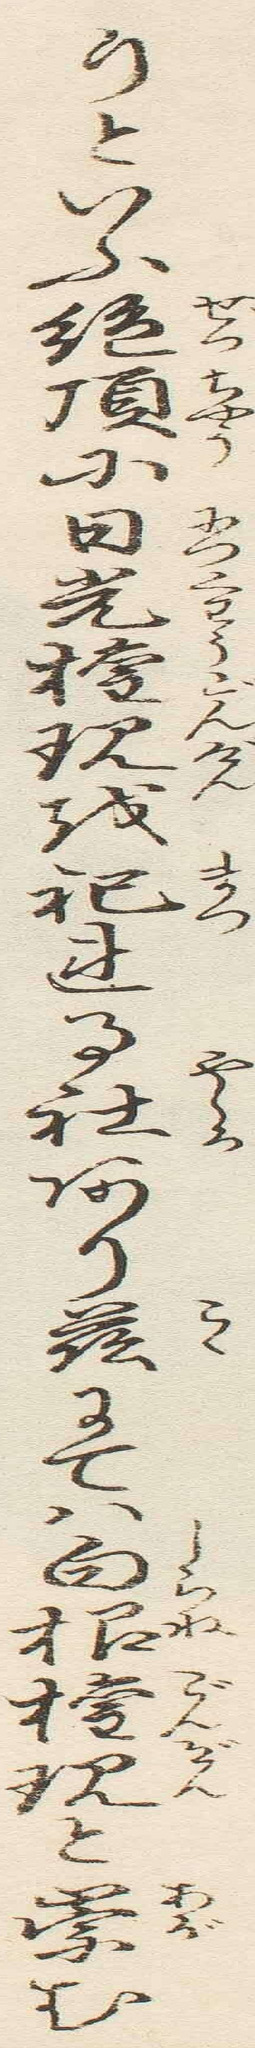りといふ絶頂に日光權現を祀れる社あり兹にては白根權現と崇む
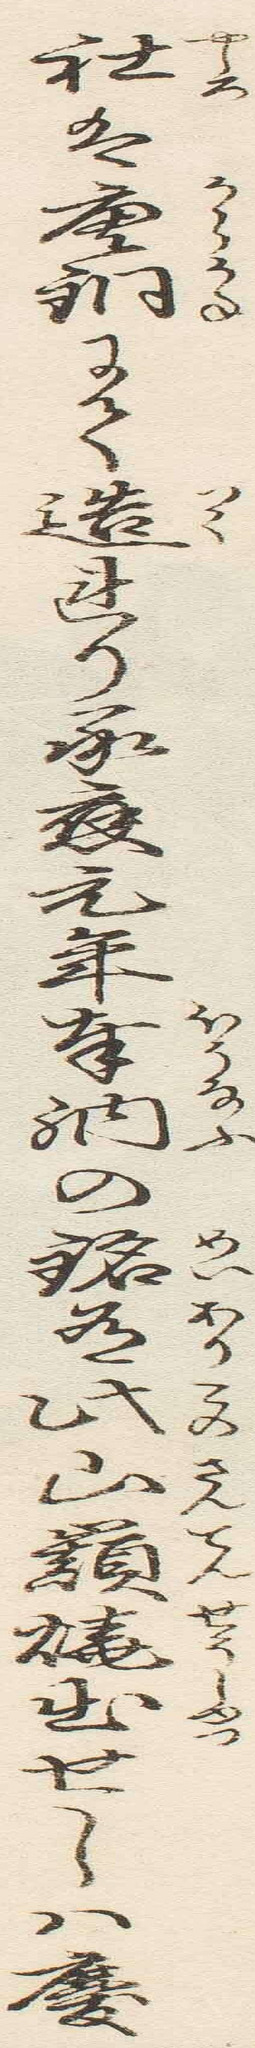社は唐銅にて造れり承應元年奉納の銘有此山巔燒出せしは慶
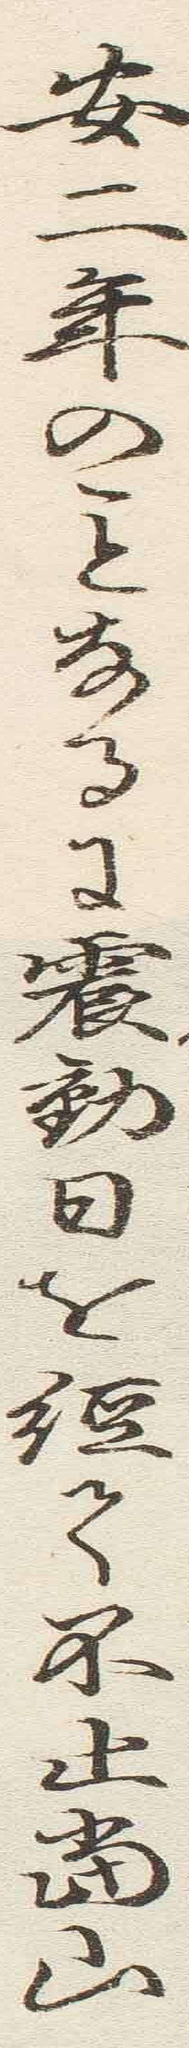安二年のことなるに震動日を經て不止當山
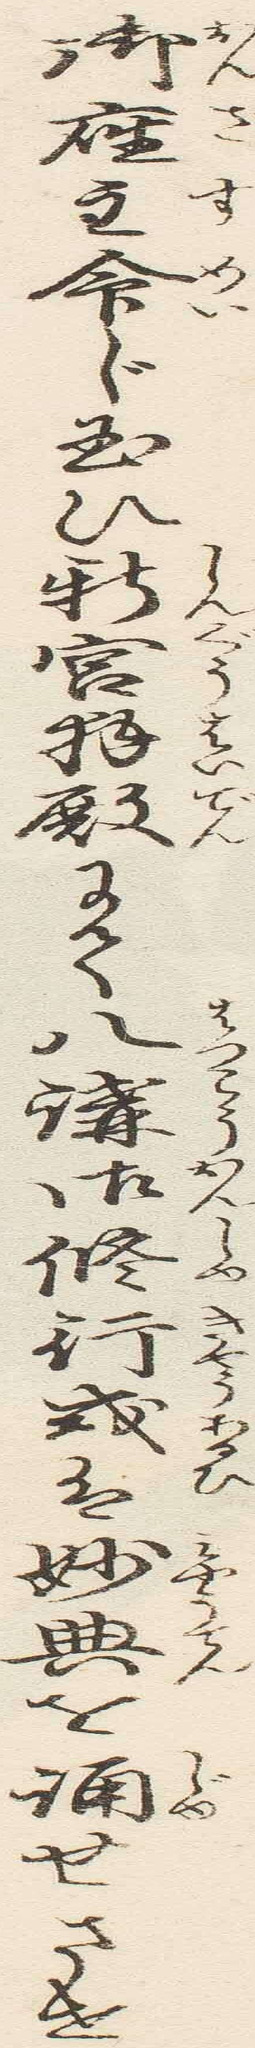御座主命じ玉ひ新宮拝殿にて八講御修行或は妙典を誦せさせ
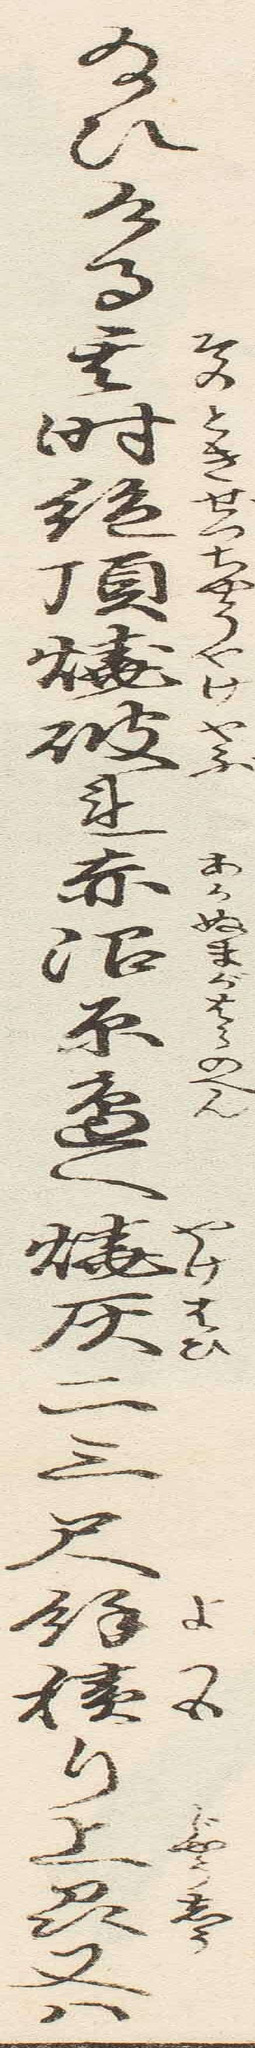給ひける其时絶頂燒破れ赤沼原邊へ燒灰二三尺餘積り上刕又は
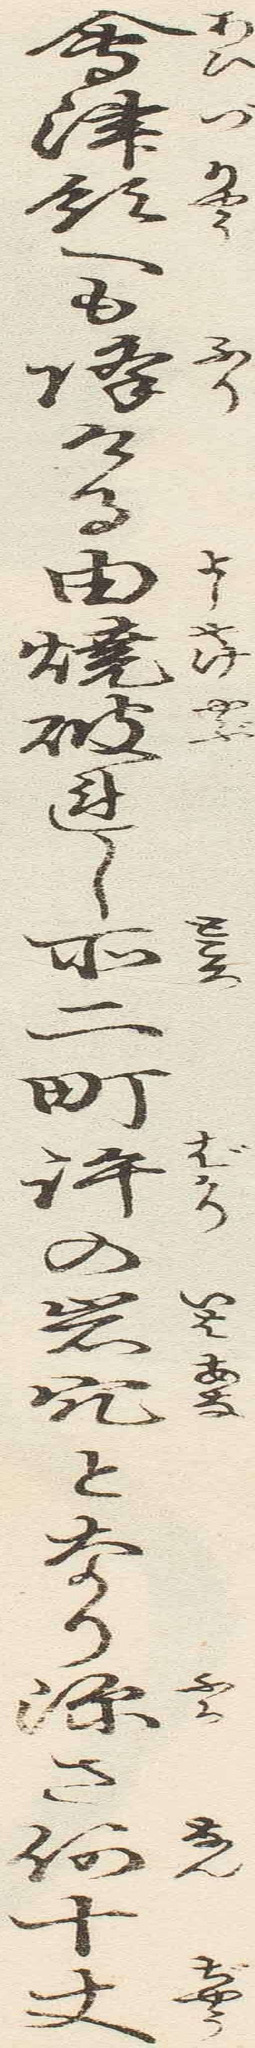會津領へも降ける由燒破れし所二町許の岩穴となり深さ何十丈
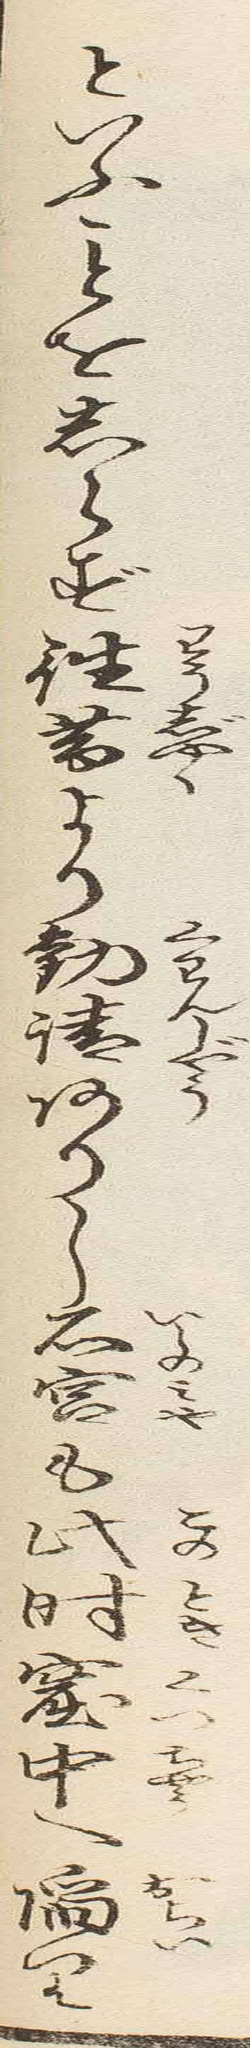といふことをしらず徃昔より勸請ありし石宮も此时窟中へ䧟り
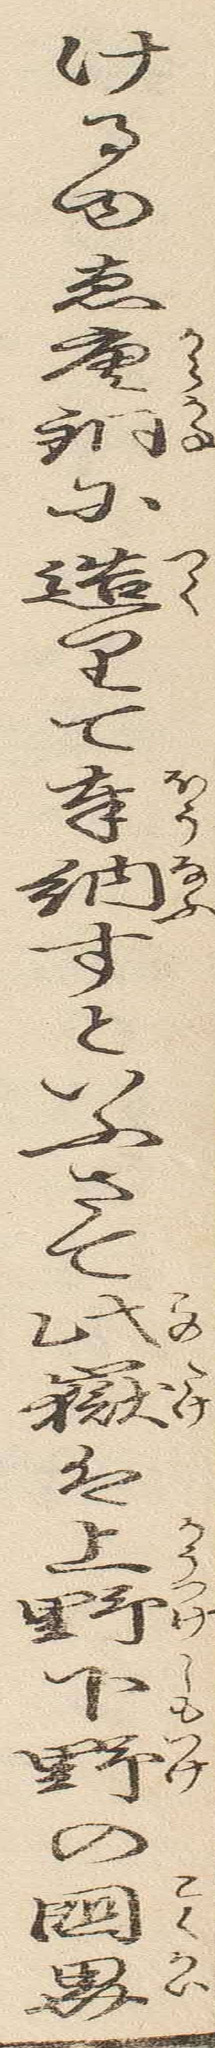けるゆゑ唐銅に造りて奉納すといふさて此嶽は上野下野の國界
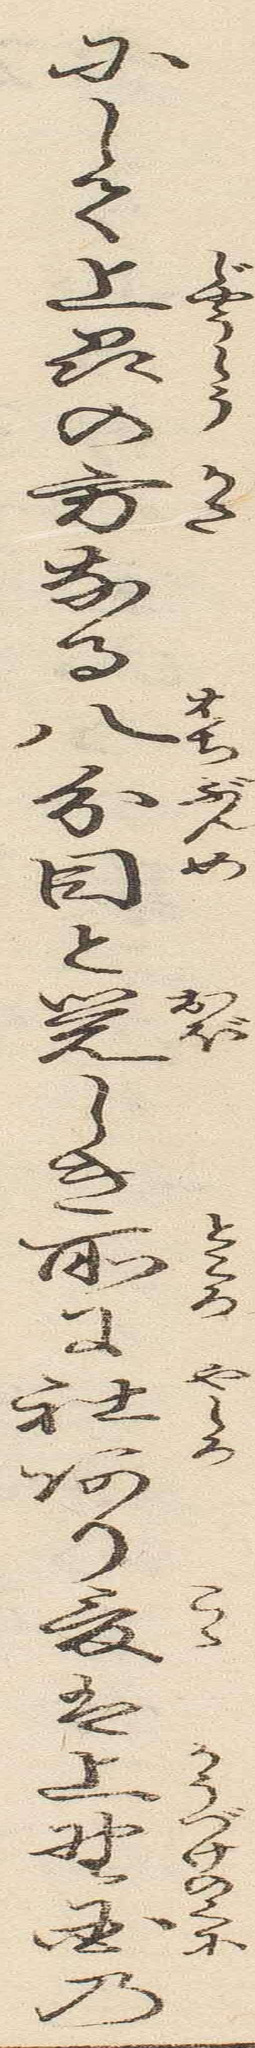にして上刕の方なる八分目と覚しき所に社あり爰は上㙒國の
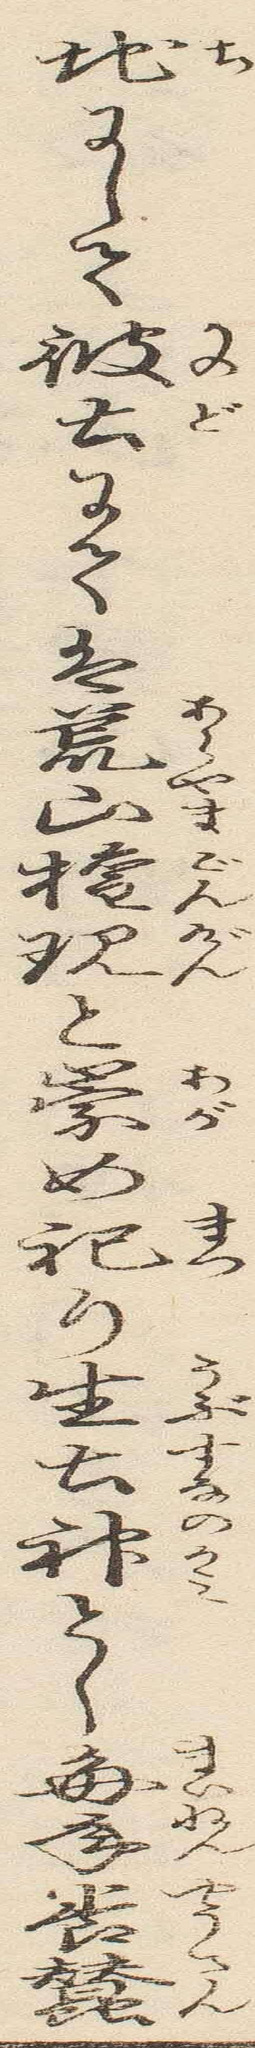地にして彼土にては荒山權現と崇め祀り生土神とし毎年養蠶
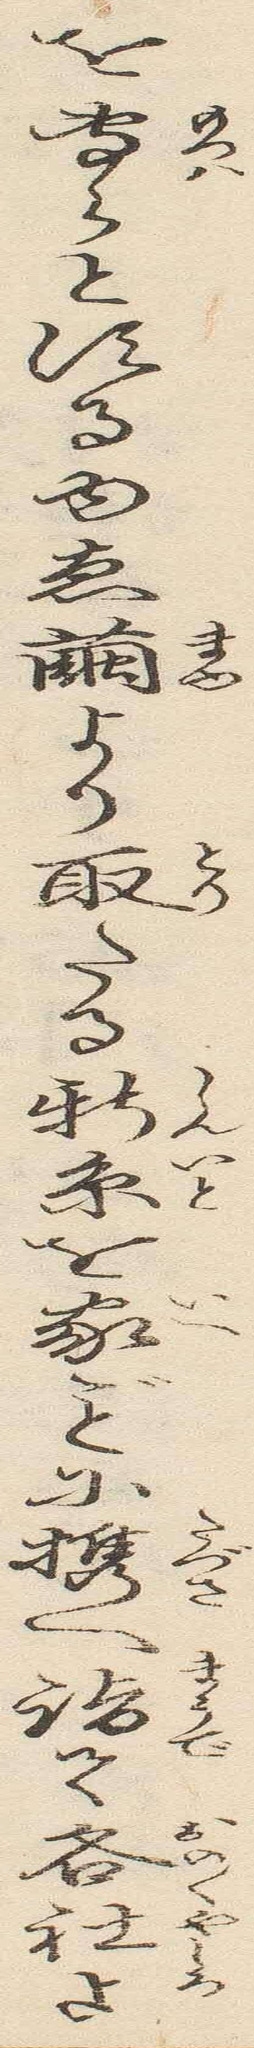を專らとするゆゑ繭より取たる新糸を家ごとに携へ詣て各社よ
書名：日光山志
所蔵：東京学芸大学附属図書館 国文学研究資料館
